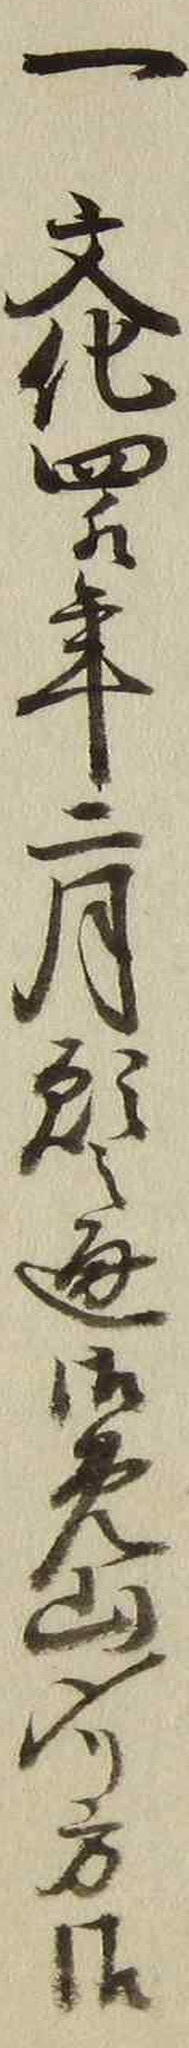一文化四卯年二月願之通御免山〆り方御
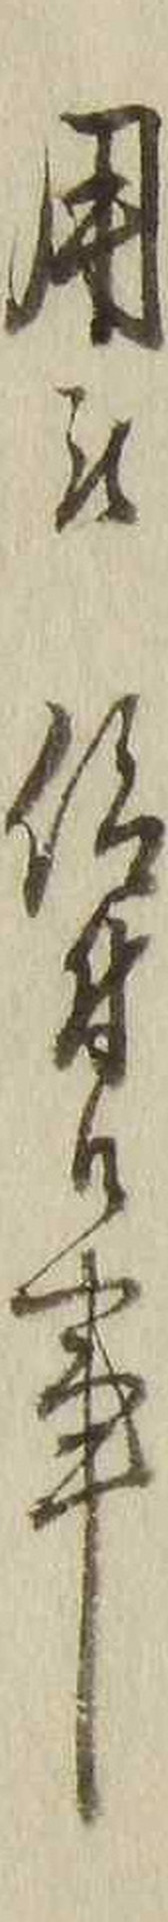用被仰付候事
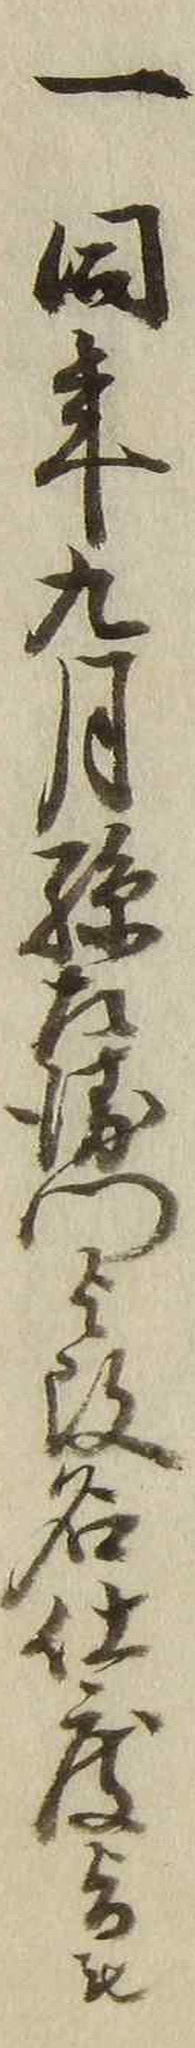一同年九月孫左衛門と改名仕度旨被
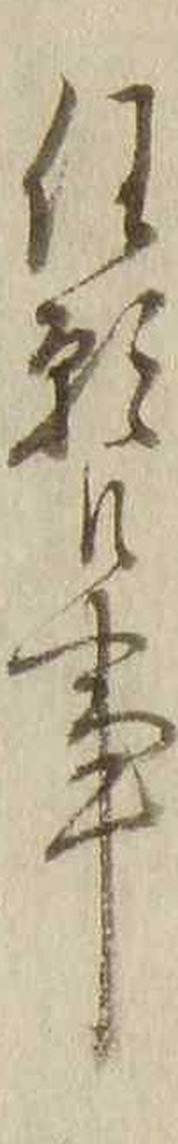任願候事

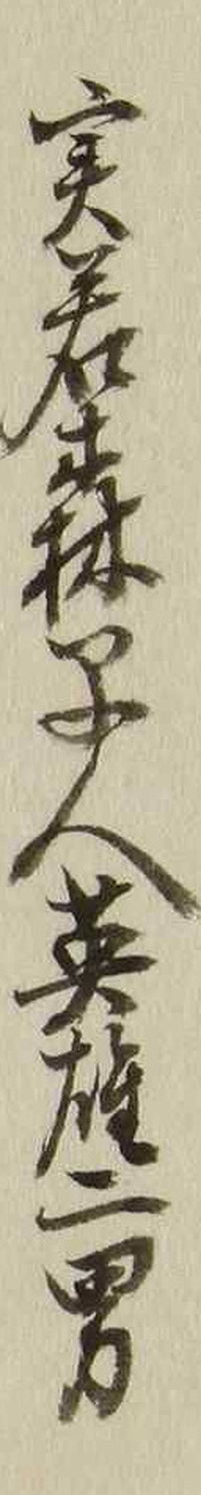実若森早人英雄二男
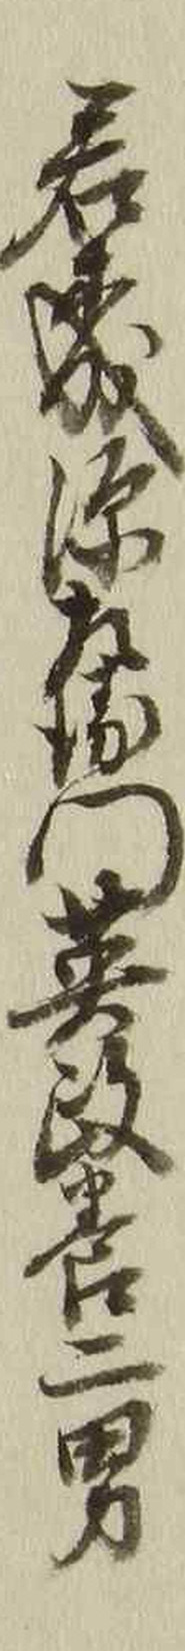若森源左衛門英政養二男
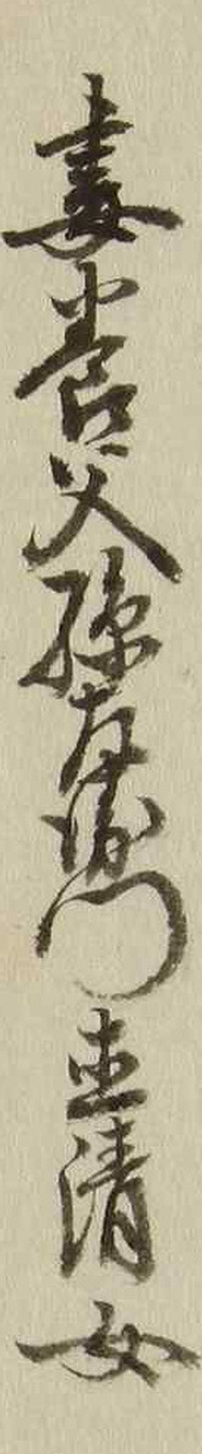妻養父孫左衛門直清女
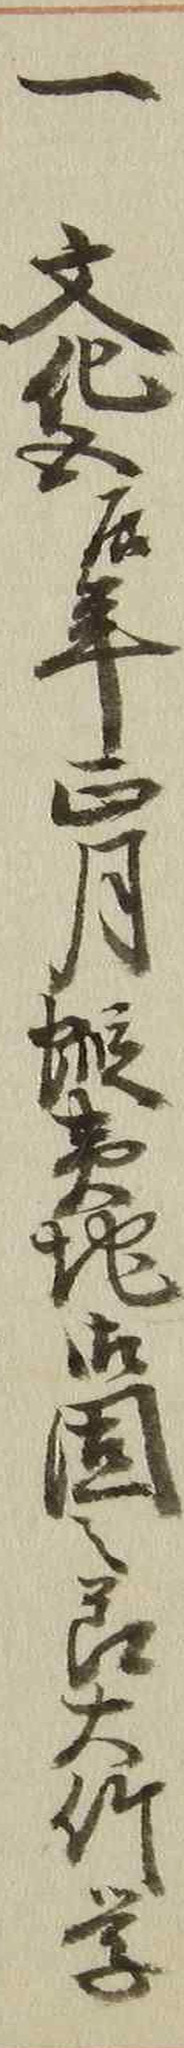一文化五辰年正月蝦夷地御固之節大竹学
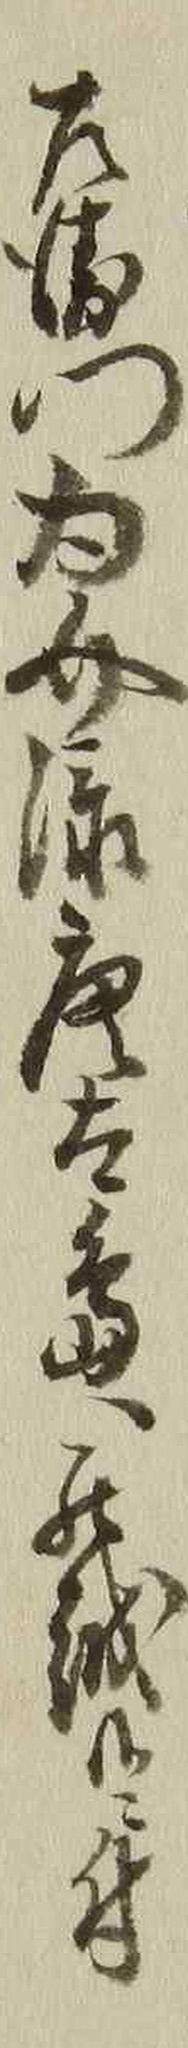左衛門為介添唐太島へ罷越候ニ付
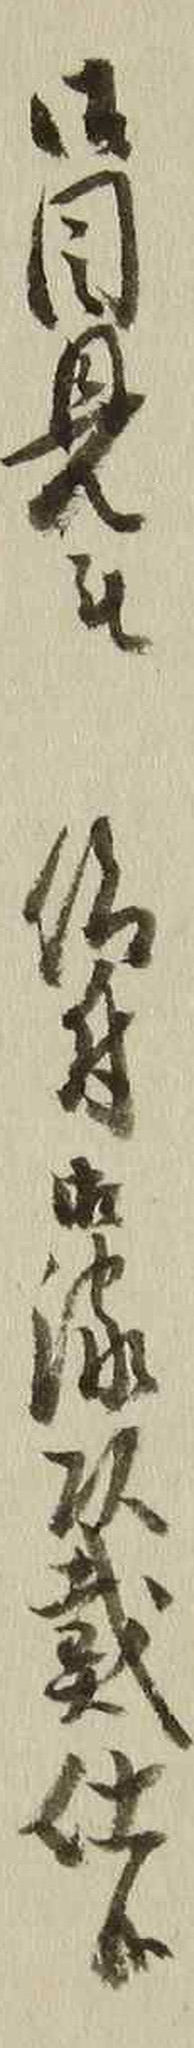御目見被仰付御流頂戴仕候
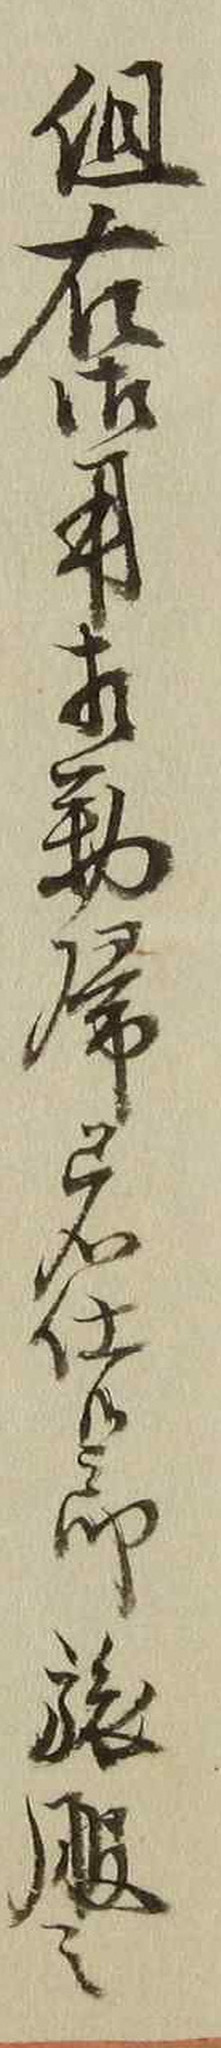但右御用相勤帰着仕候節旅服之
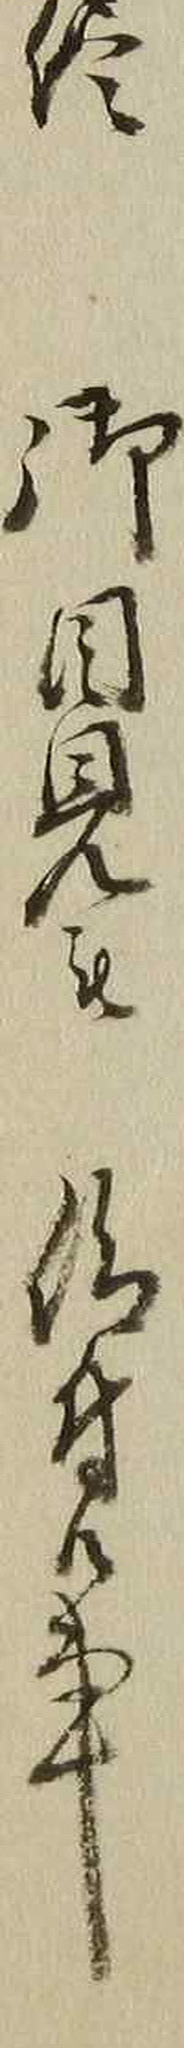儘御目見被仰付候事
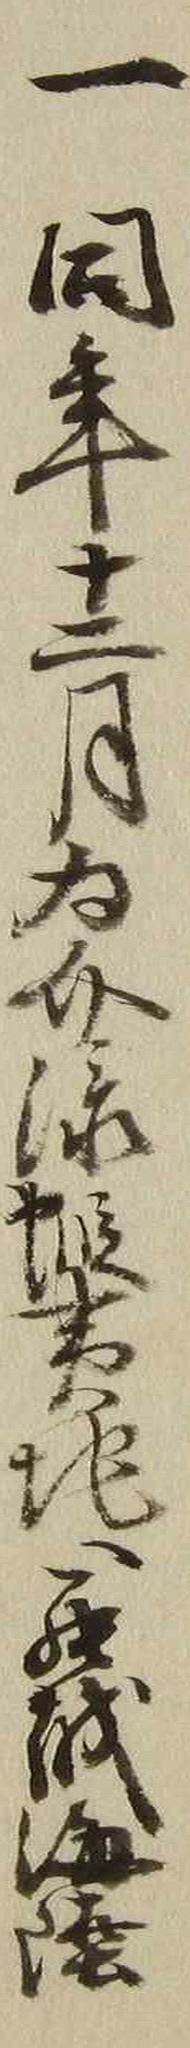一同年十二月為介添蝦夷地へ罷越海陸
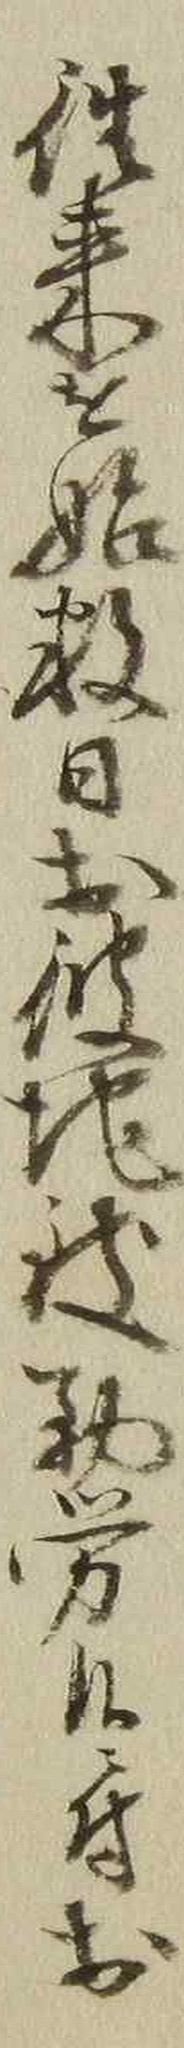往来を始数日於彼地致勤労候ニ付於
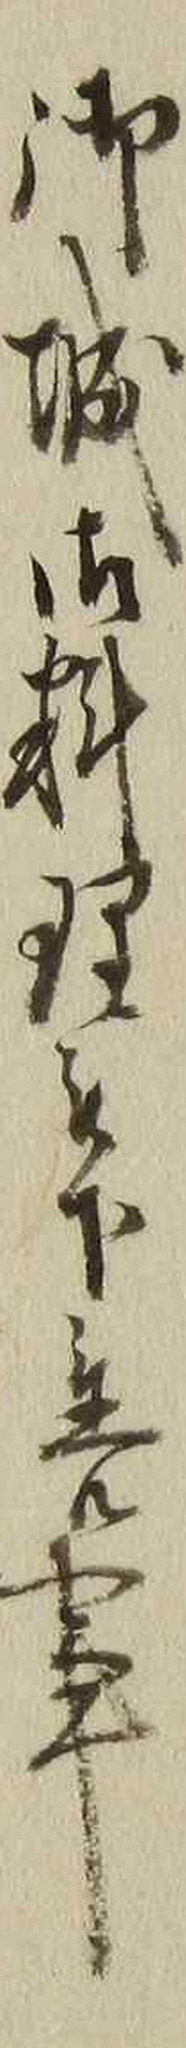御城御料理被下置候事
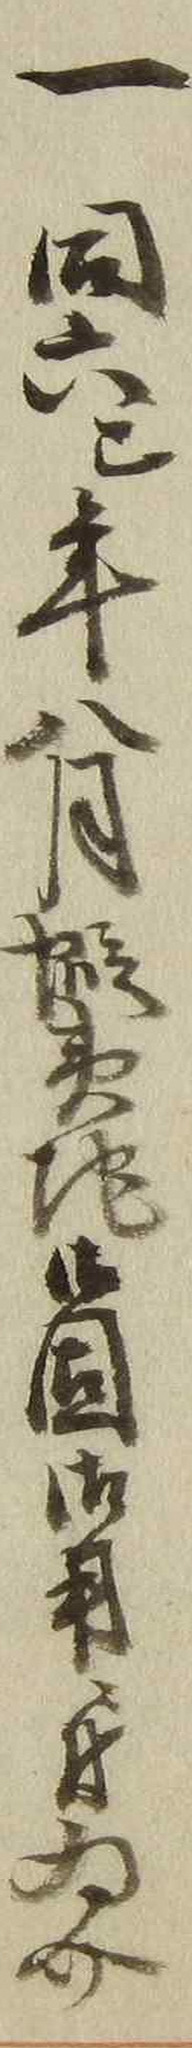一同六巳年八月蝦夷地御固御用ニ付為介
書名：諸士系譜　巻之53　に之部4
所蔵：会津若松市立会津図書館
